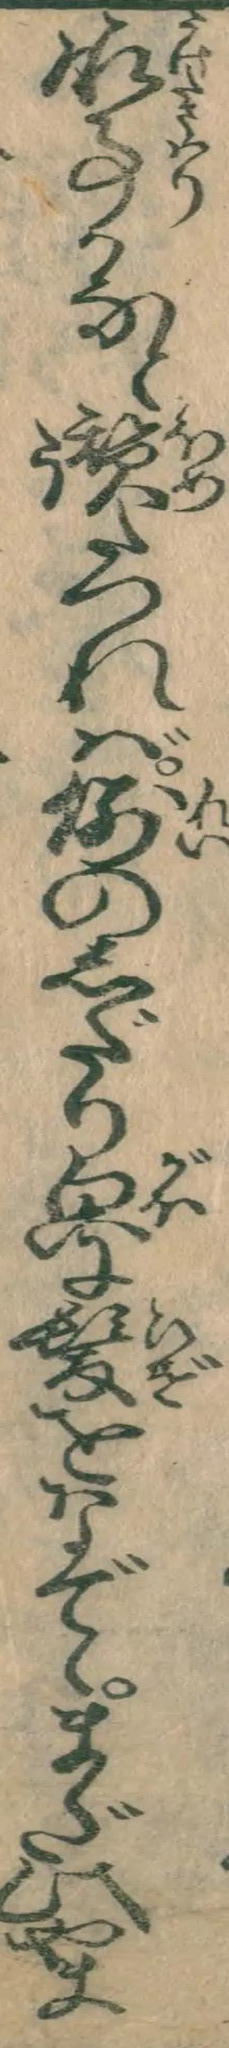承事かなと讃たつれば。例のしだり貌に髪をなでゝ。まだ此やま
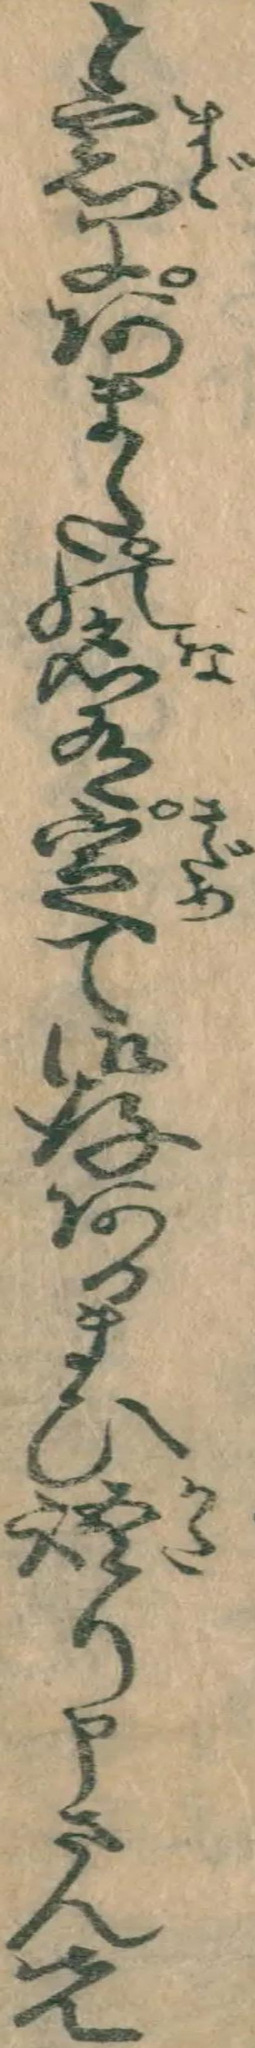と窓に。あまた。の名有。定て御存あるまひ語り申さん先

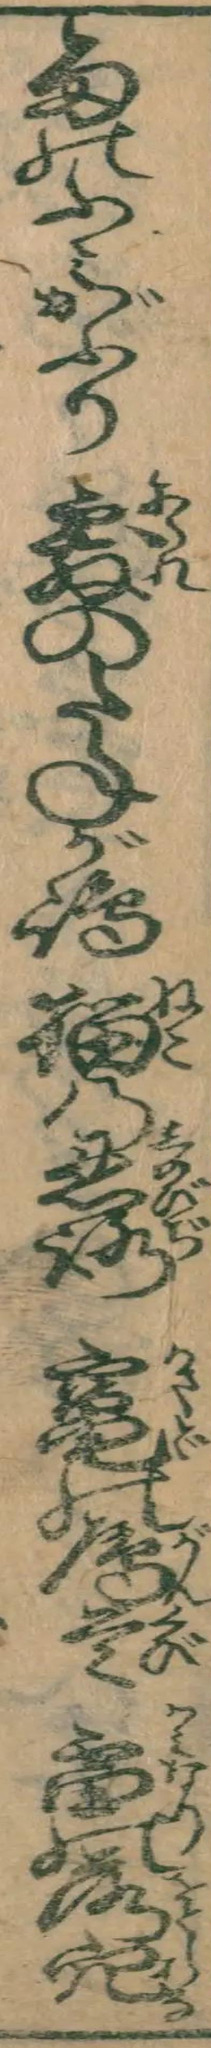雨のふみがふり霰のたねが島猫の忍路竃の雁首雷の落穴
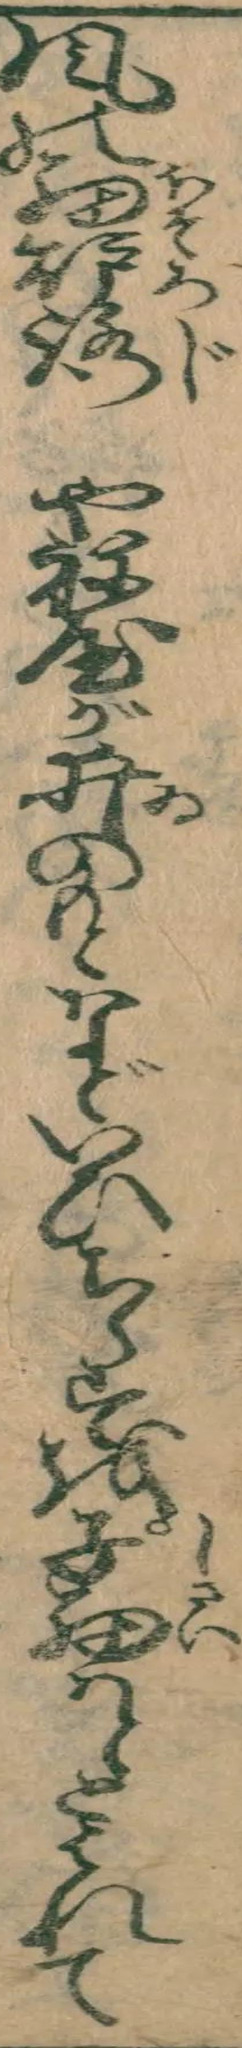風の細炉路やね屋が井のもとなどいひちらすを。子細はととはれて
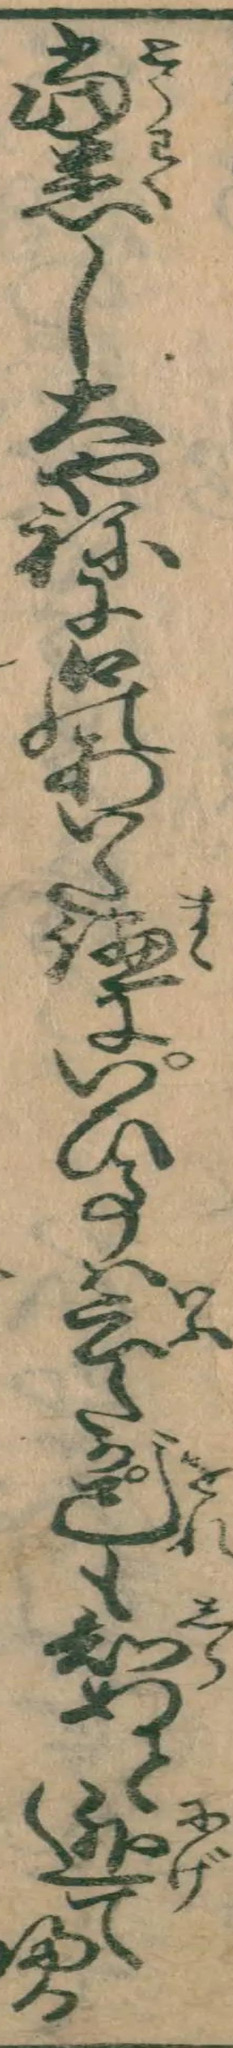当惑し大やねに口のあいた侭に。いひ事は云たが。己も知ぬと逃て帰る
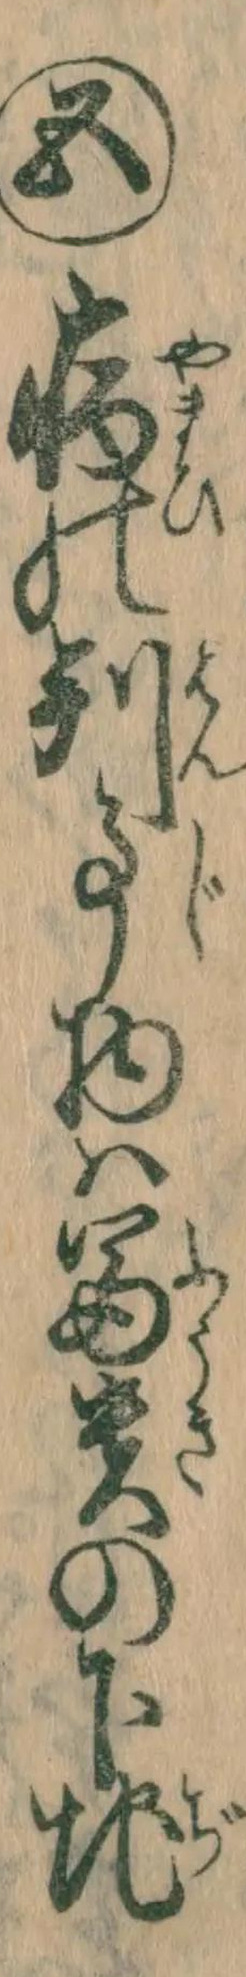五病の判事物は富貴の下地
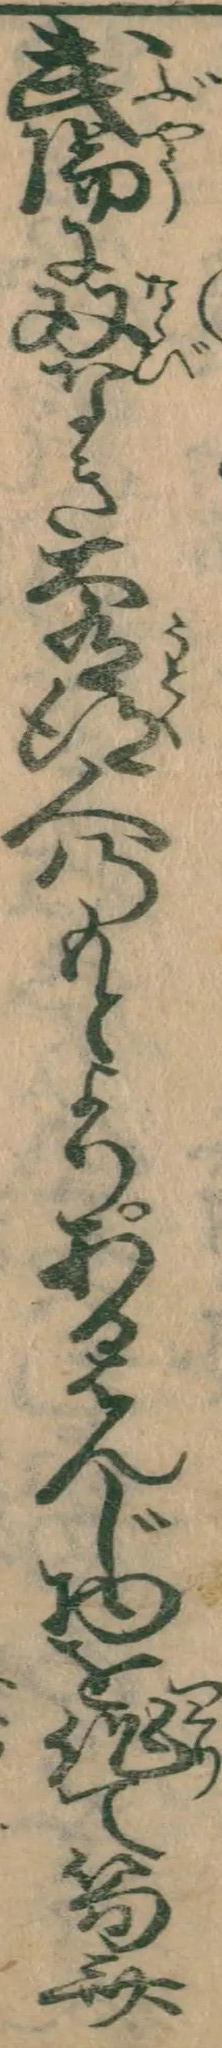武陽に双なき大有得人のもとより。あるはんじ物を作て筍斎
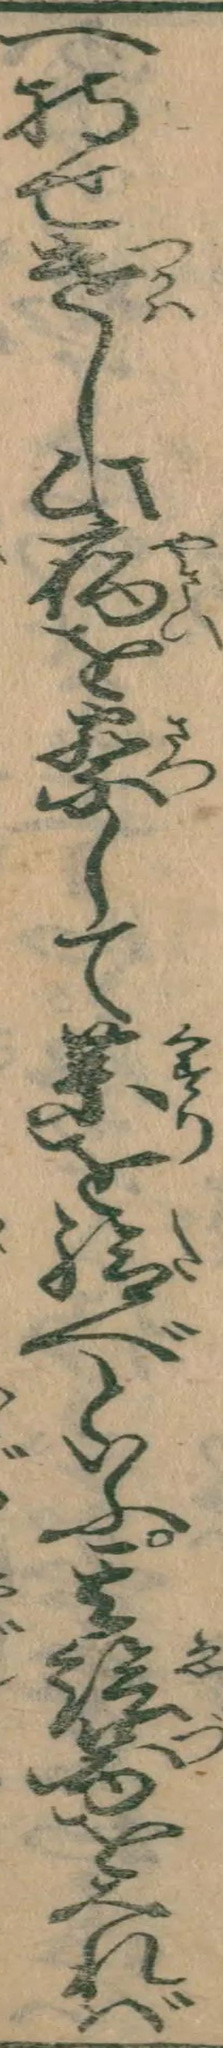へ持せ遣し此病を察して薬を給べといふ。其絵図をみれば
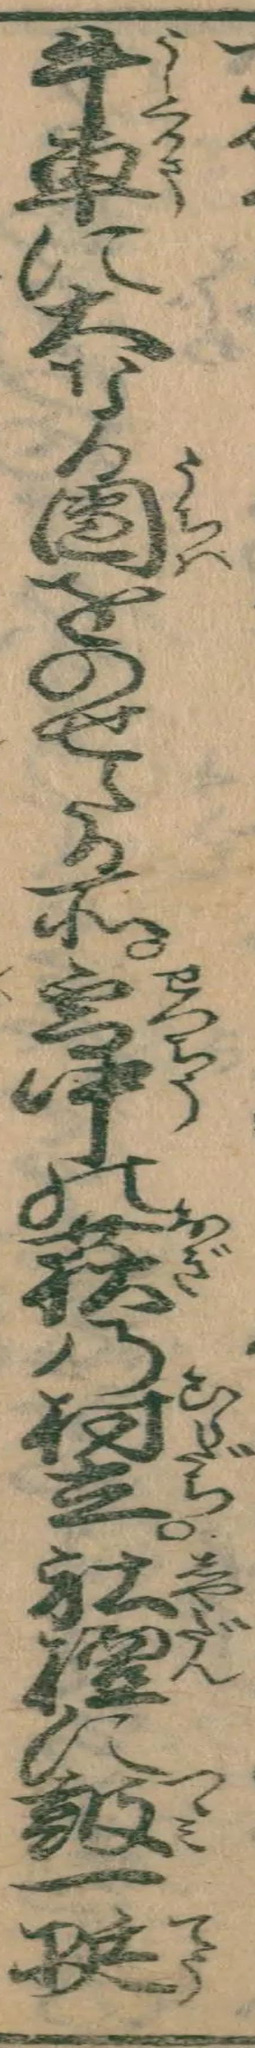牛車に大なる団をのせたる所。雪中の荻の村立。社檀に鼓一挺
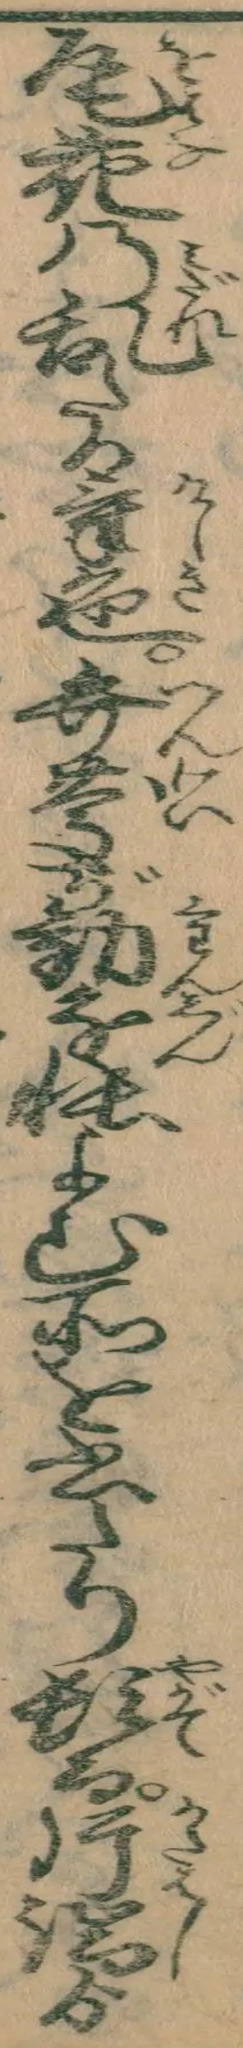尾花の乱たる気色。弁慶が勧進帳よむ所を書たり頓て。片端ゟ
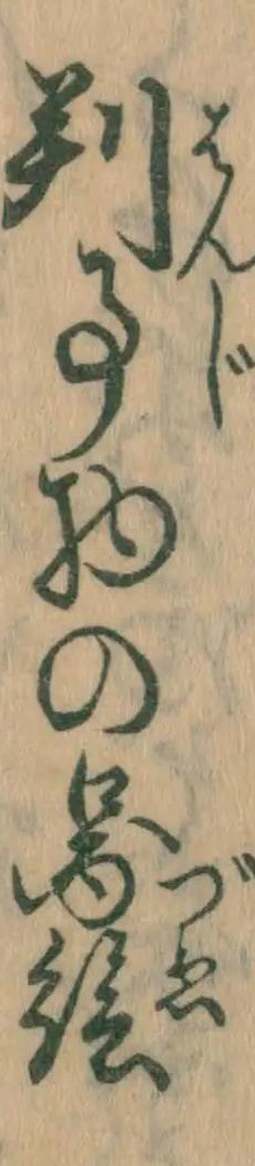判事物の図絵

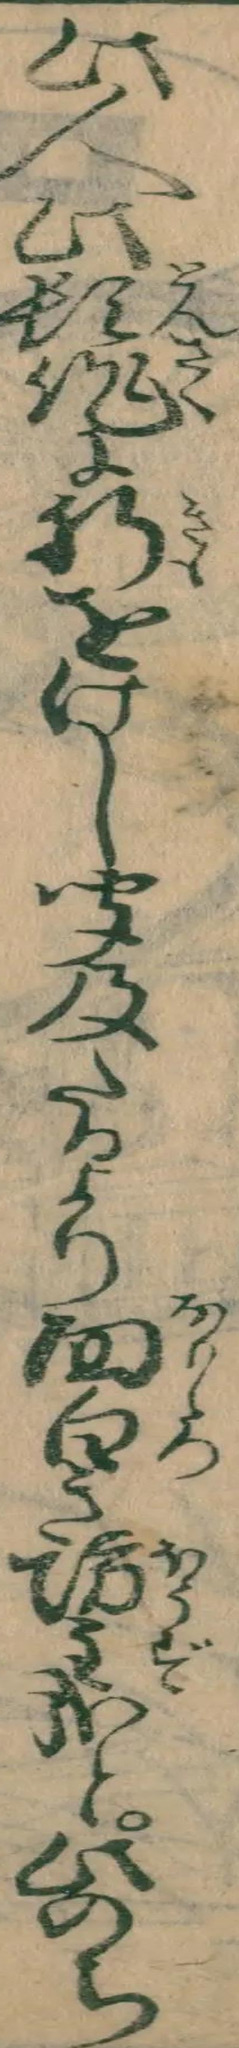此人此頓作に肝をけし聞及たるより面白き坊主哉と。此のち
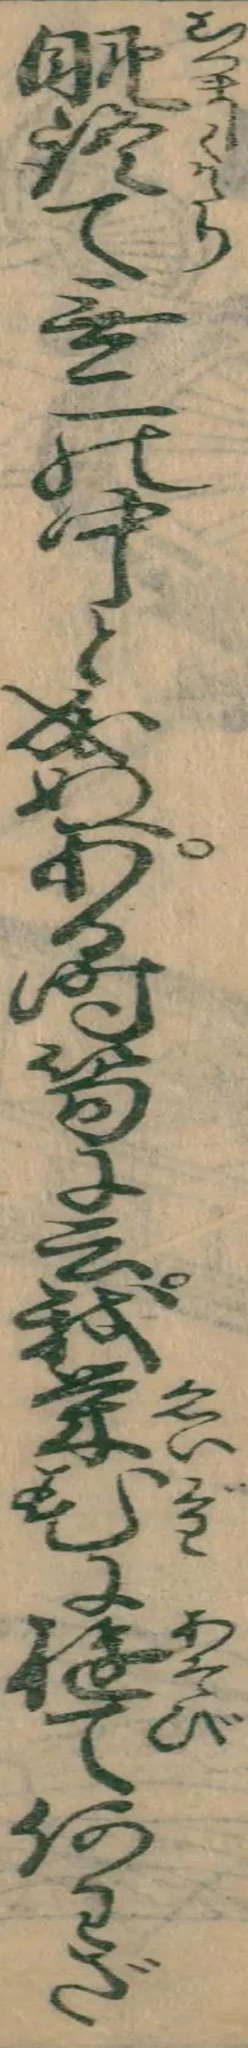眤語て無二の中と成ぬ。ある時筍に云。我栄花に遊て何わざ
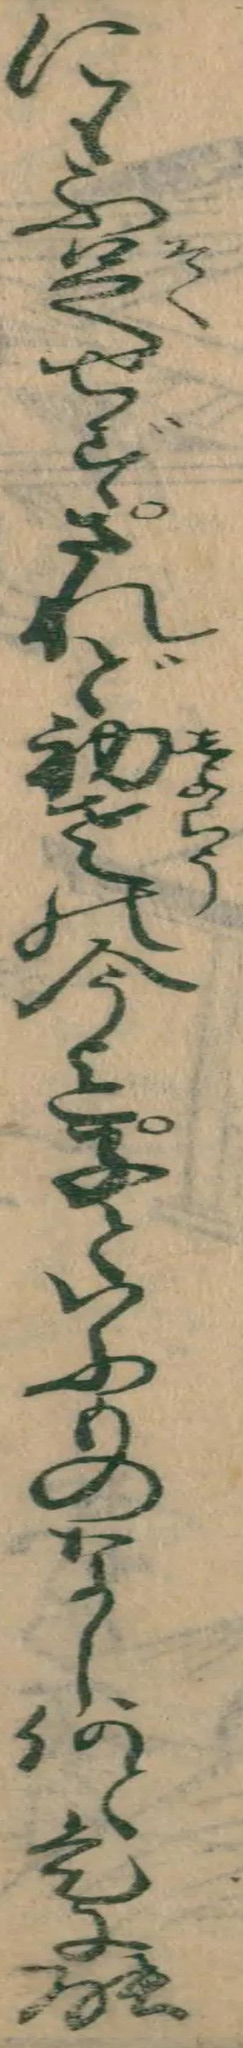にもふ足せず。されど初老の今迄。子といふものなし何と是に能
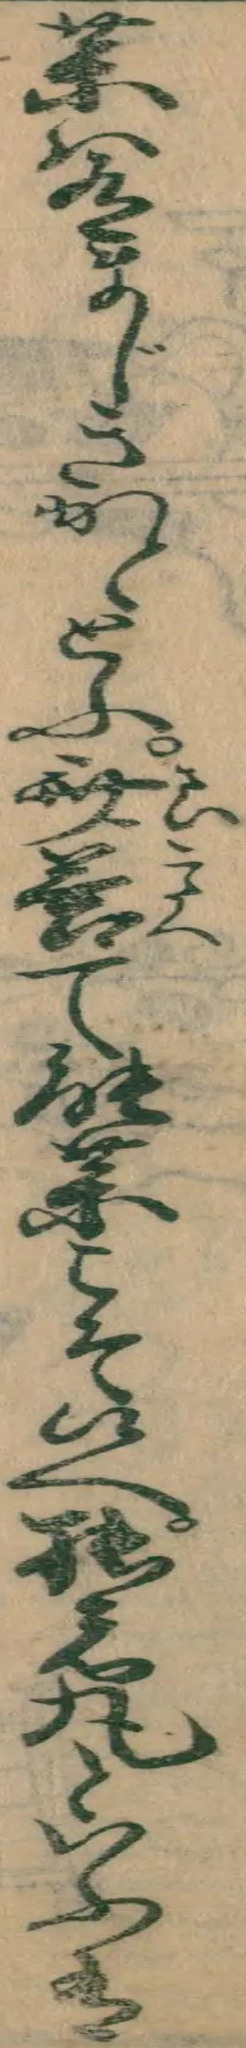薬は有まじきかととふ。斎答て能薬こそ候へ。拙者丸といふ有
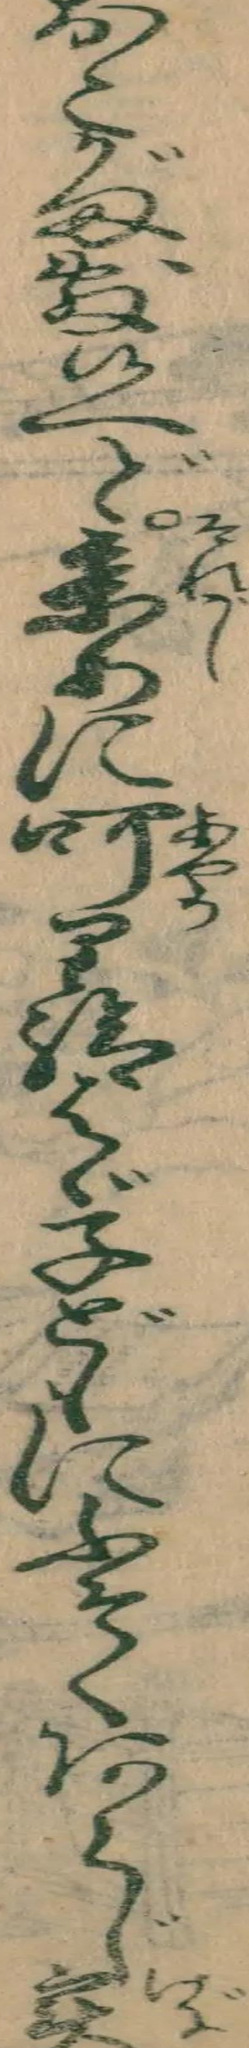おこがま敷候へど。某めに呵り給はゞ子どもにふそくあらじ実
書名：新竹斎 5巻
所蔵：国立国会図書館 National Diet Library, JAPAN
